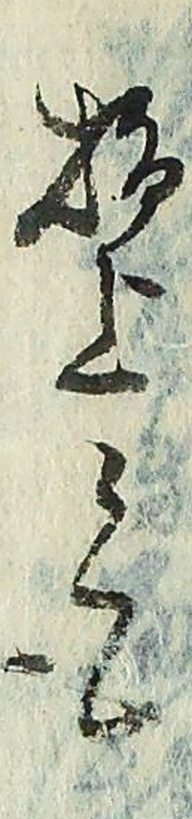指上候以上
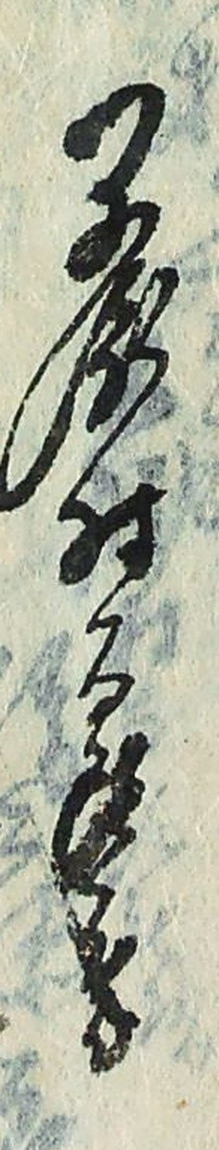早淵村与頭庄屋
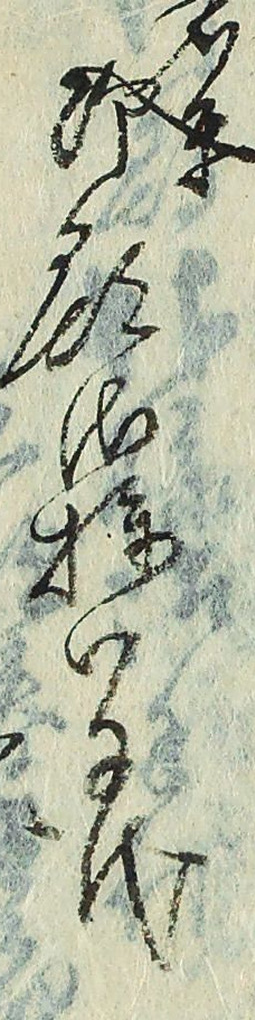御郡代様御手代
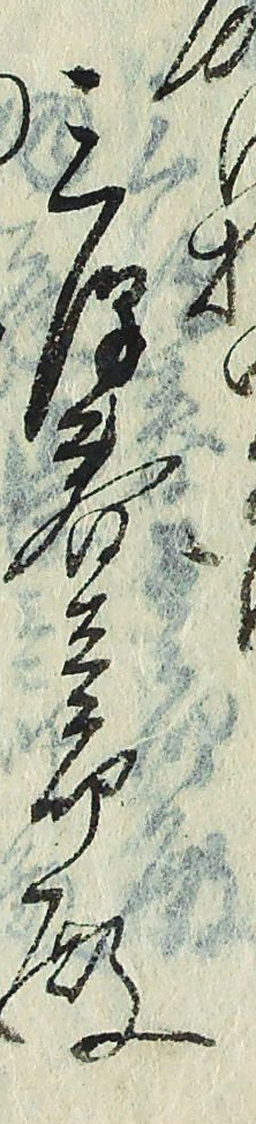三沢春太郎殿
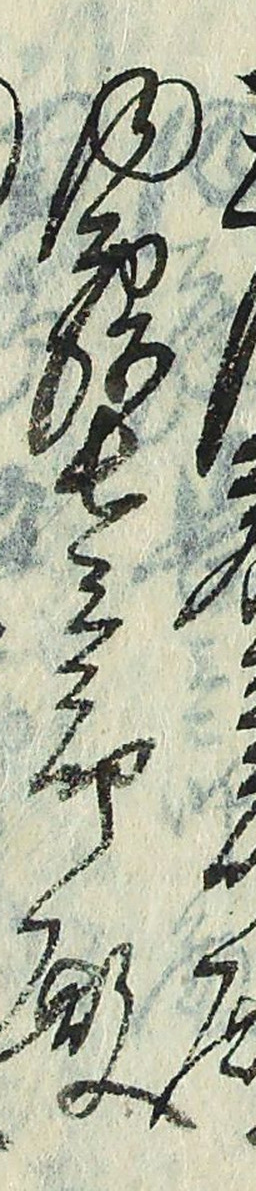内藤長三郎殿
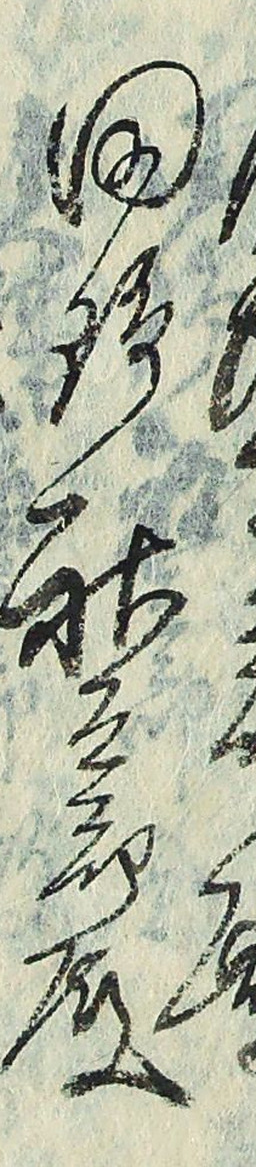田野祐太郎殿
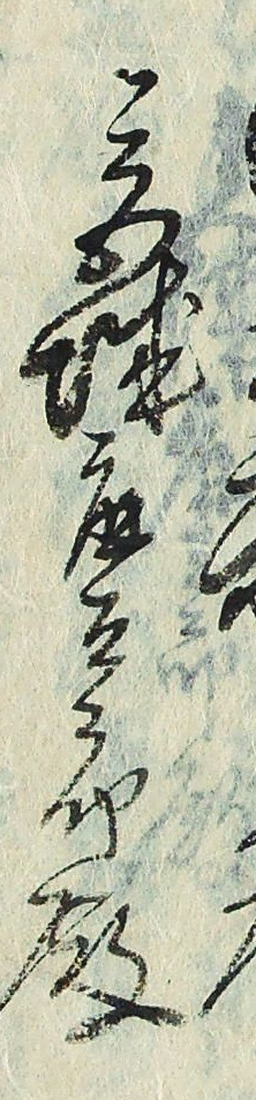宮城麻太郎殿

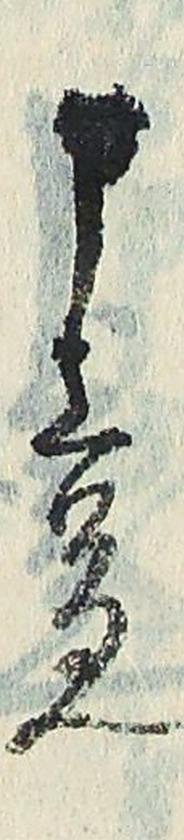申上覚
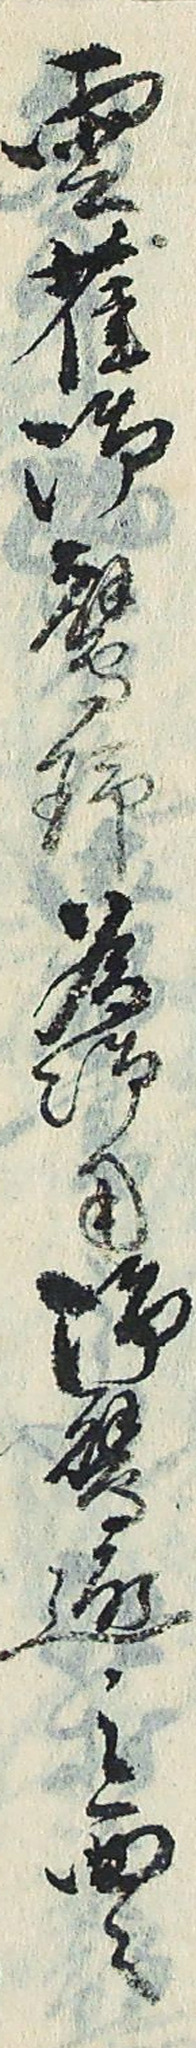雲雀御鷹野為御用御鷹匠之面々
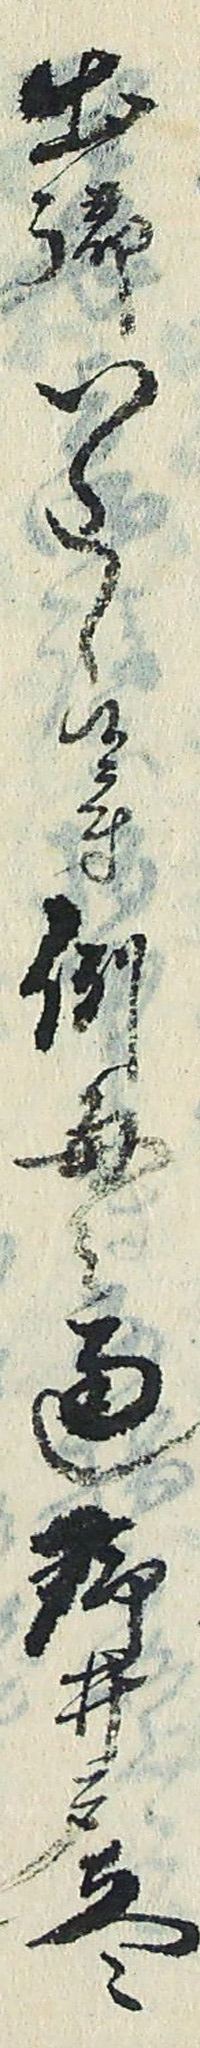出郷いたし候に付例毎之通野井戸夫々
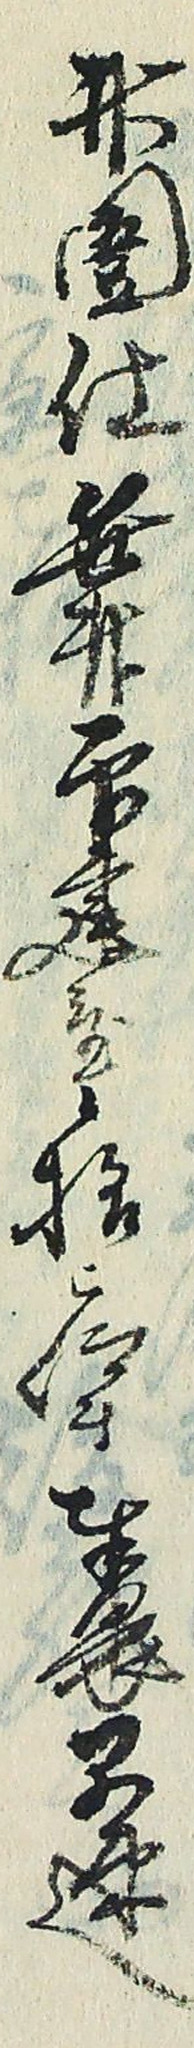竹囲仕笹竹印建置候様被仰付奉畏早速
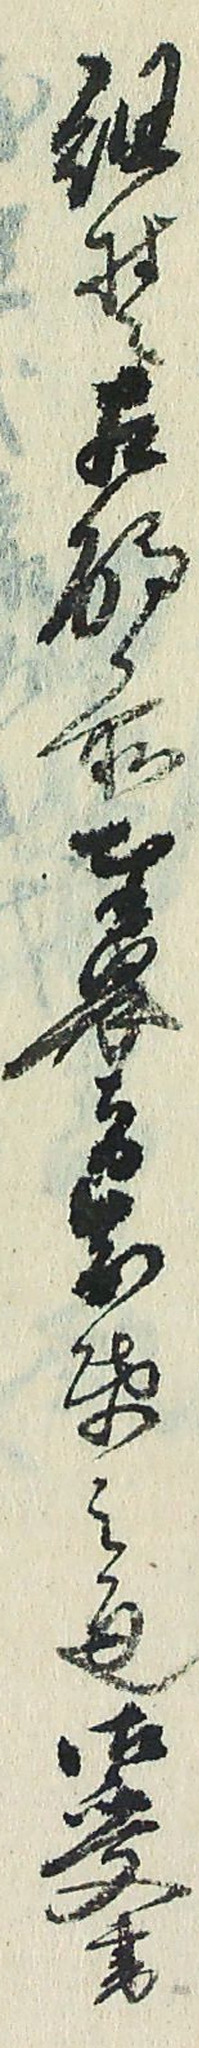組村々相触候所奉畏旨別帋之通御受書
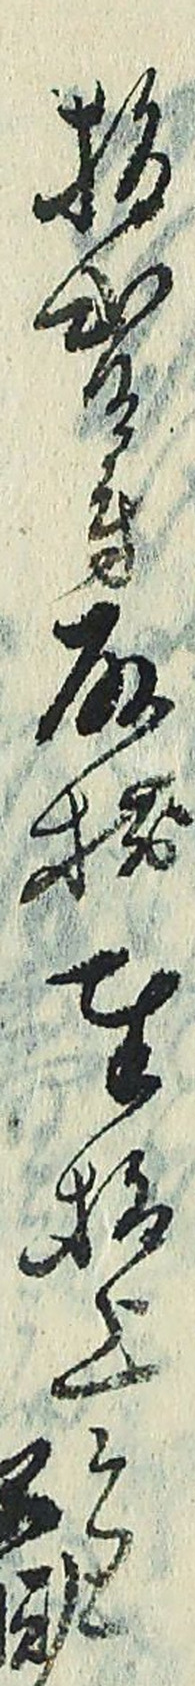指出候に付取揃奉指上候以上
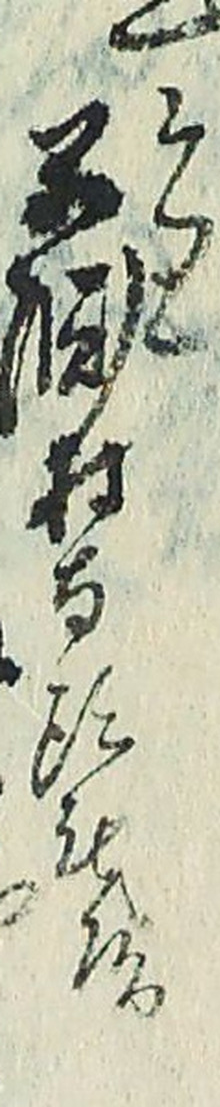早淵村与頭庄屋
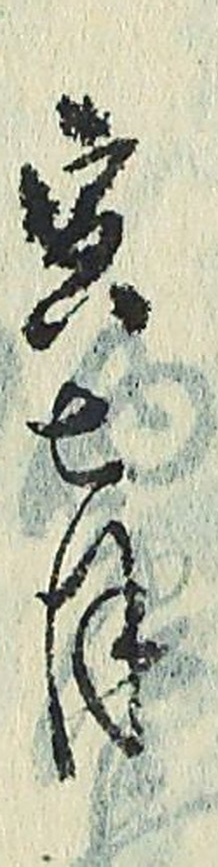寅七月
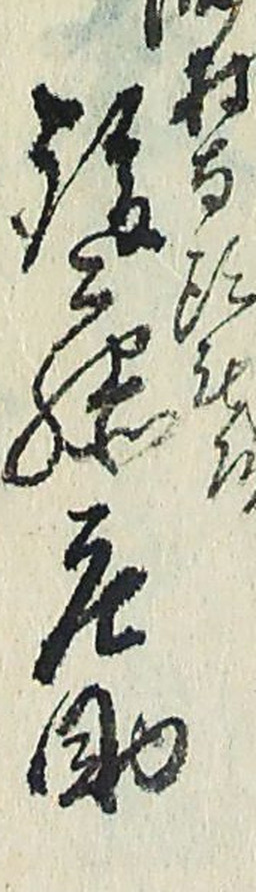後藤庄助
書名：諸御用御□受書控
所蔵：鳴門教育大学 Naruto University of Education
